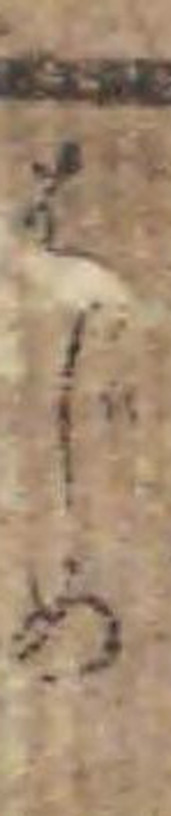はじめ
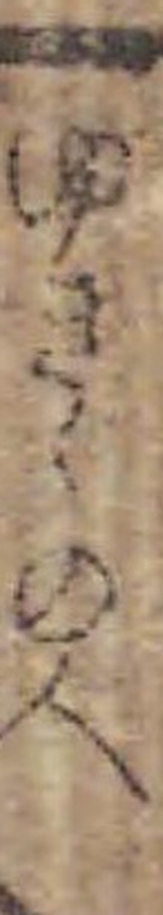ゆきゝの人
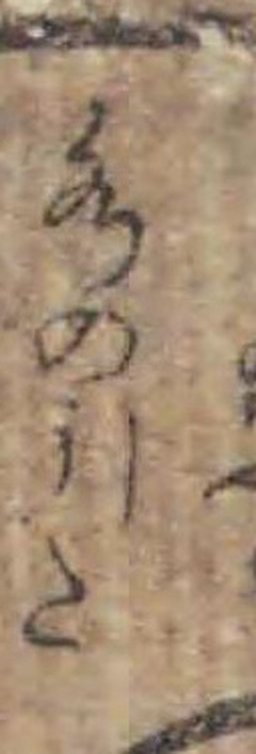水の引た
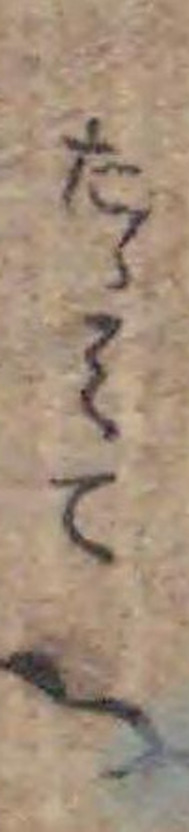たゝみて
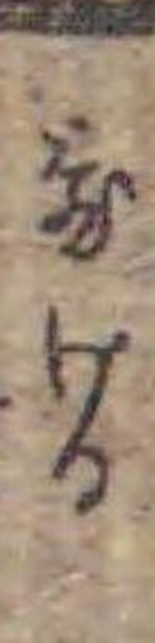置ける
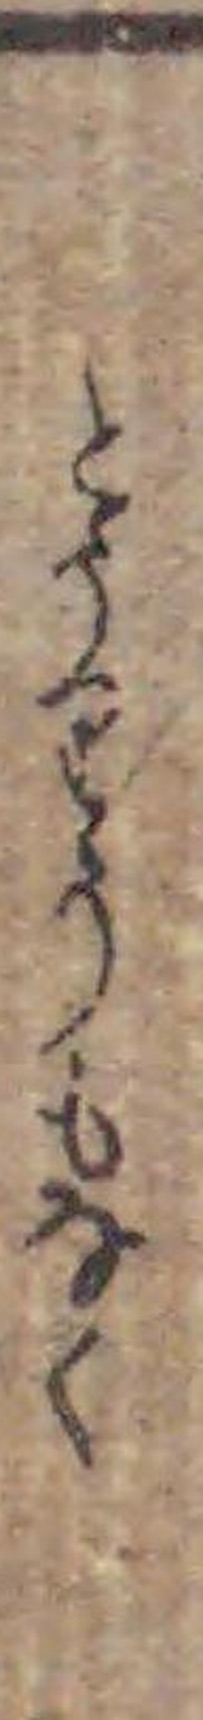とうりうもなく
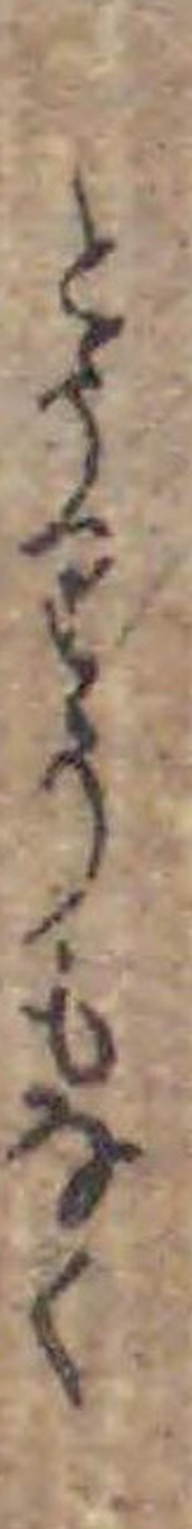とうりうもなく
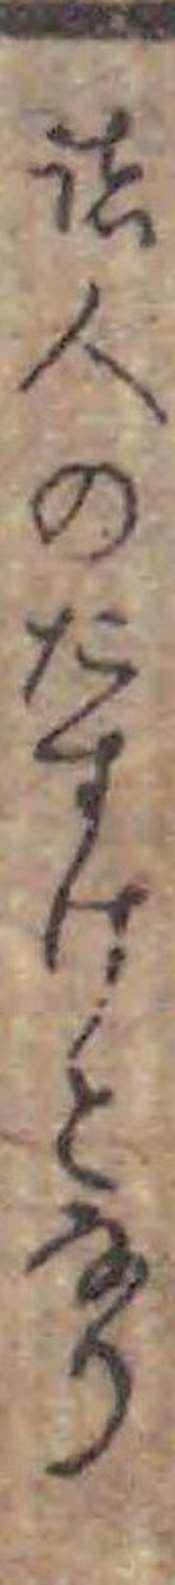諸人のたすけとなり
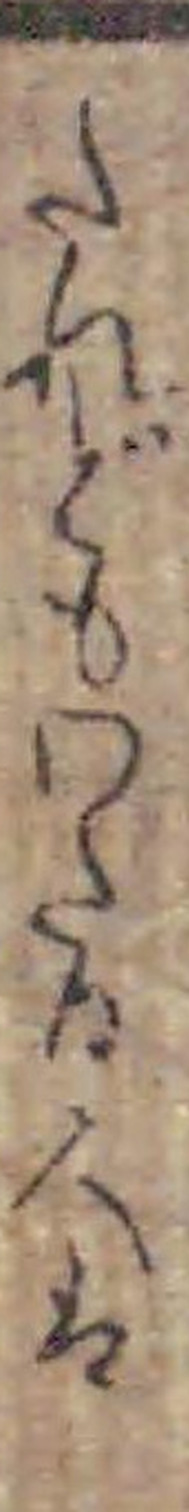たれどもわたる人は
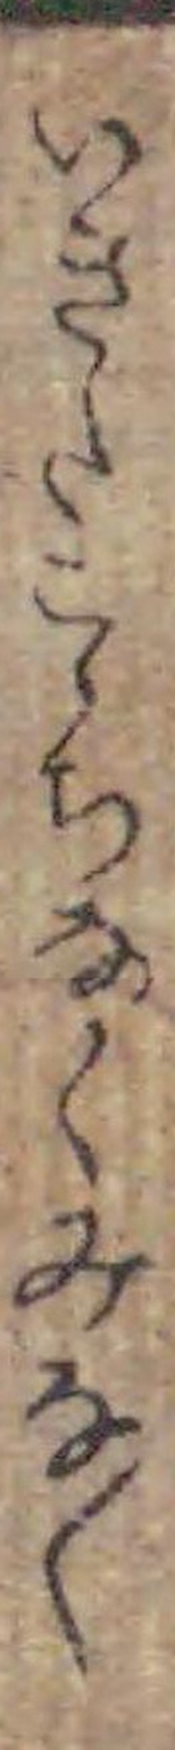いきたこゝちなくみな〳〵
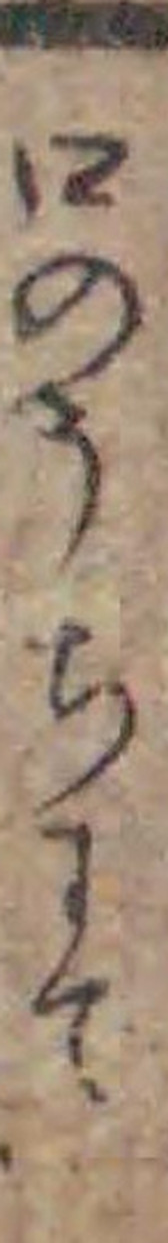口のうちにて
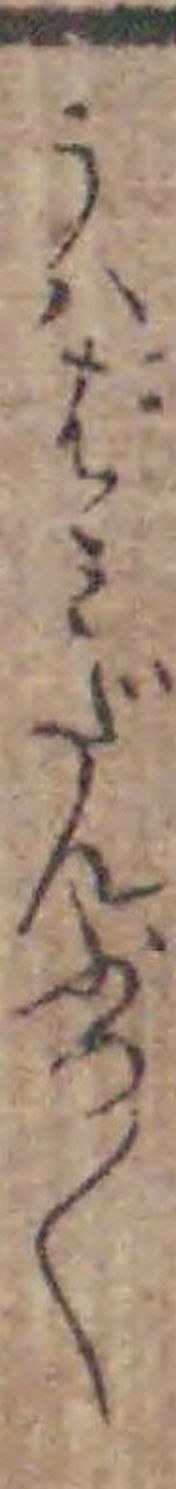うはばみだんぶつ〳〵

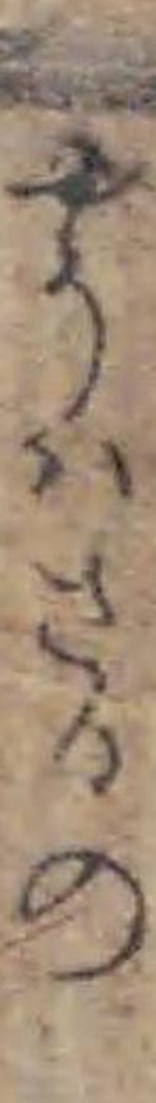やうはさるの
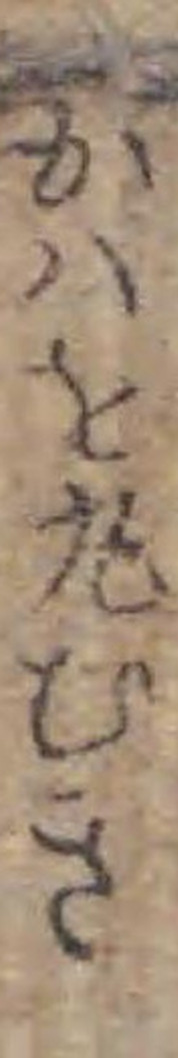かはを丸むき
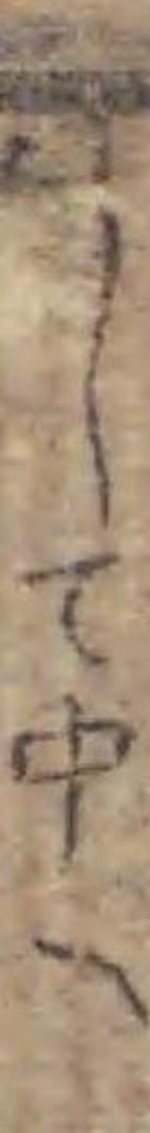にして中へ
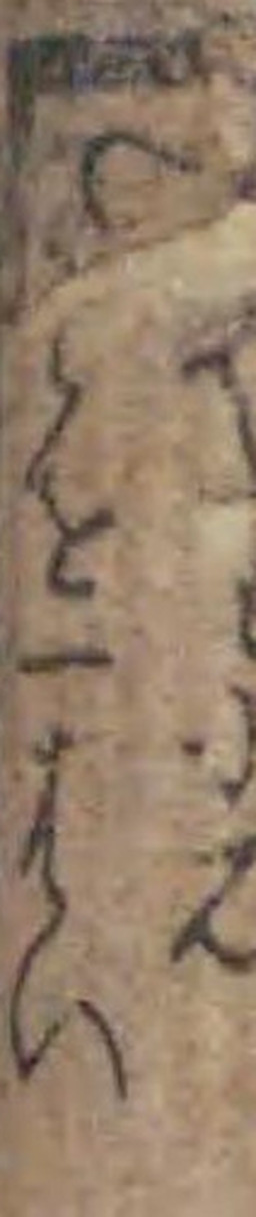を一はい
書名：虚言八百万八伝 : 3巻
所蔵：国立国会図書館 National Diet Library, JAPAN
